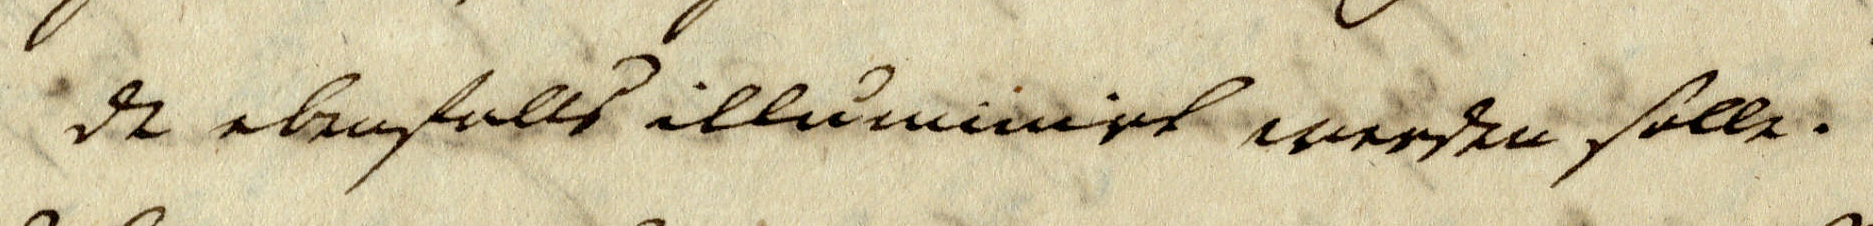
de ebenfalls illuminirt werden solle.
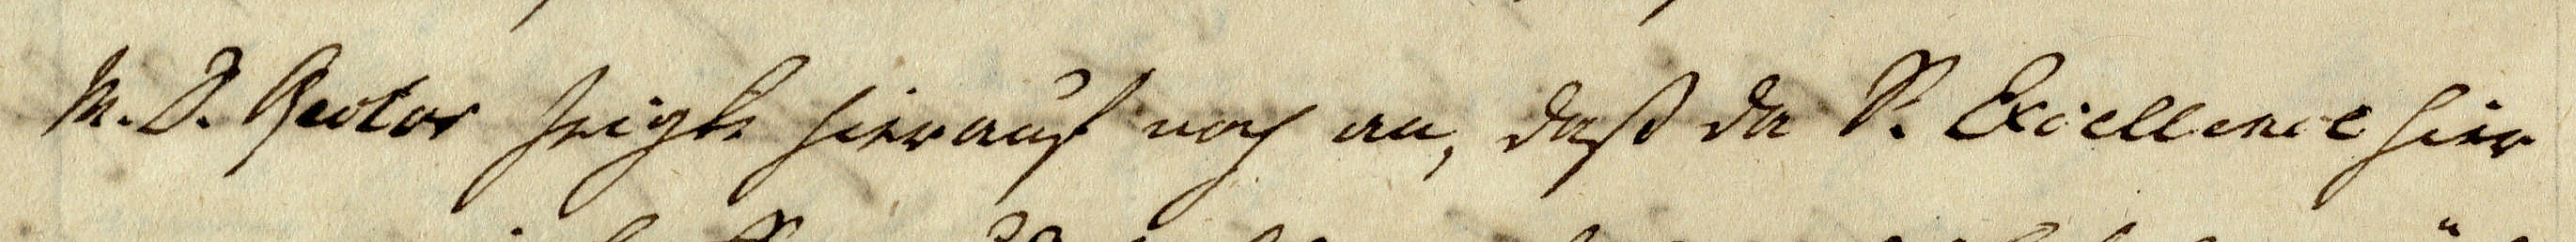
M. D. Rector zeigte hierauf noch an, daß da Sr Excellence hier
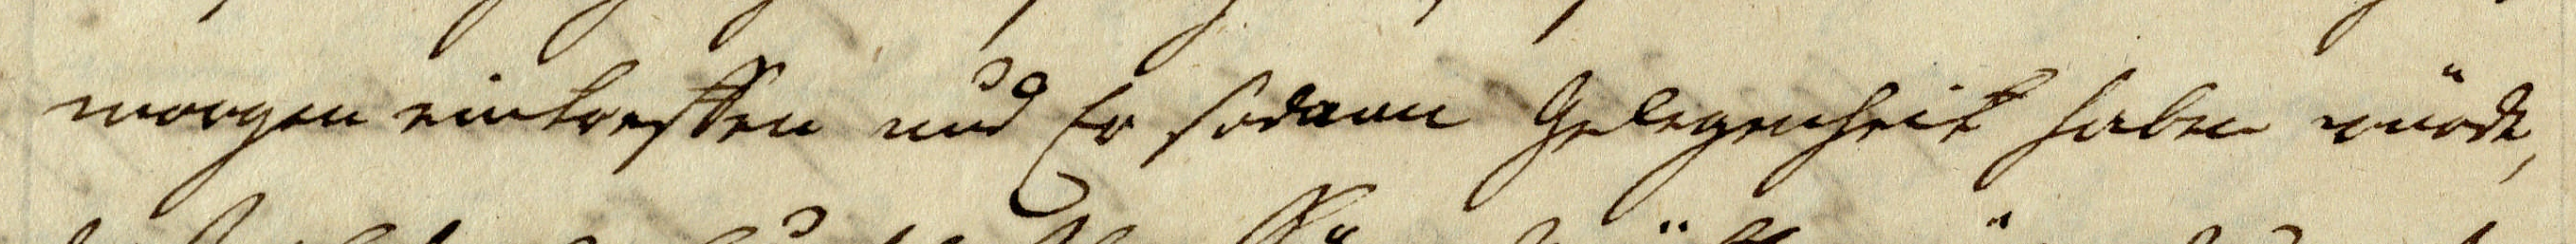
morgen eintreffen und Er sodann Gelegenheit haben würde,
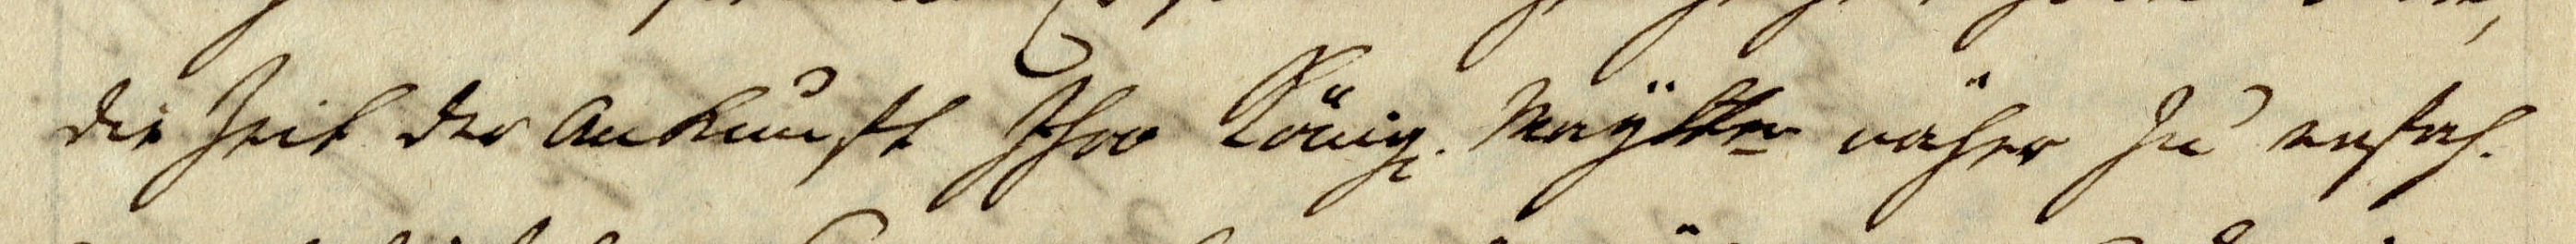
die Zeit der Ankunft Ihro König. Maÿtten näher zu erfah¬
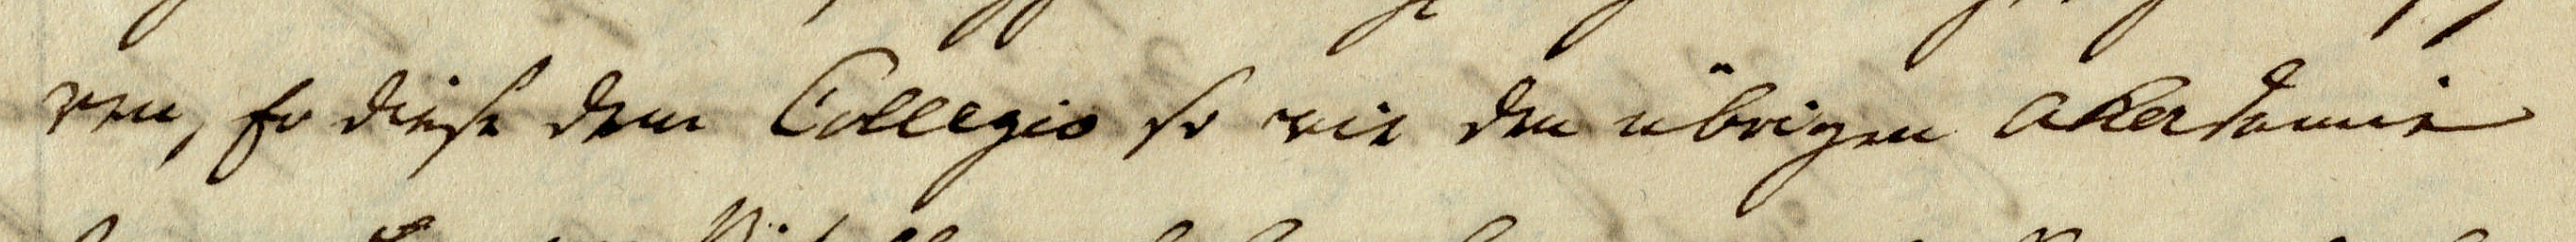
ren, Er diese dem Collegio so wie den übrigen Akademie
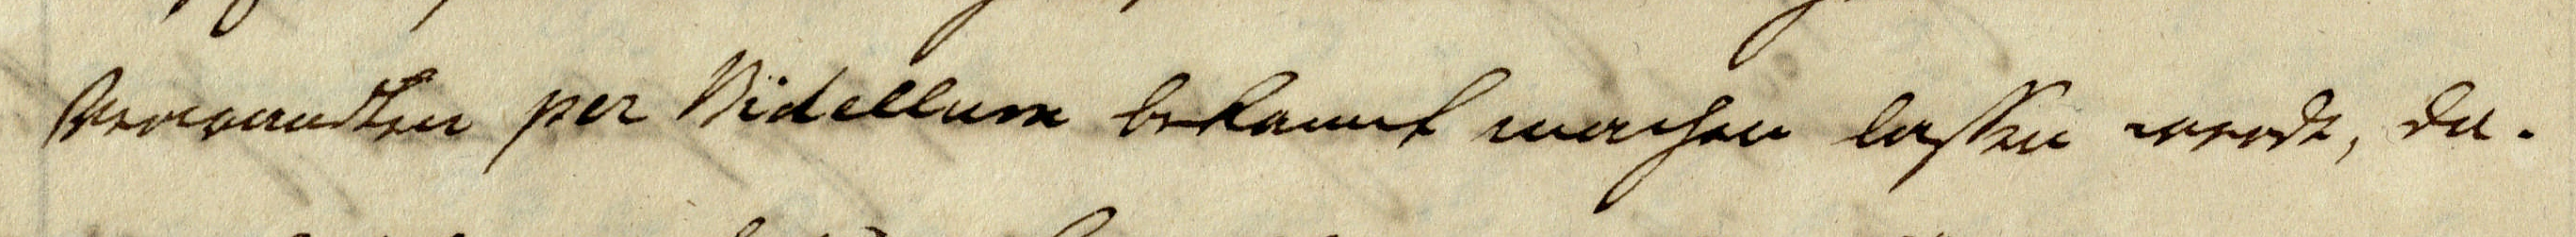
Verwandten per Bidellum bekannt machen lassen werde, da¬
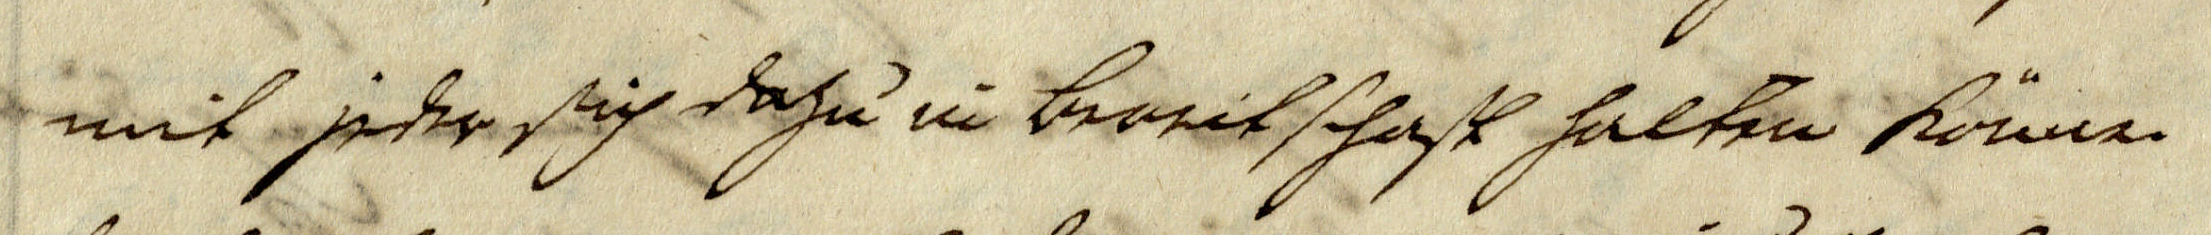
mit jeder sich dazu in Bereitschaft halten könne.
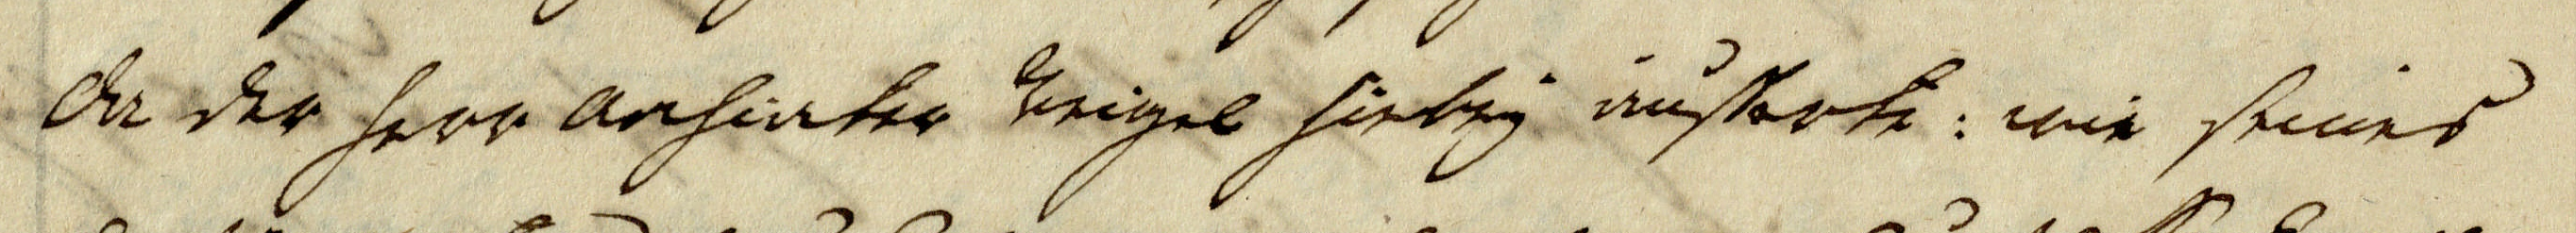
Da der Herr Archiater Weigel hiebeÿ äusserte: wie seines
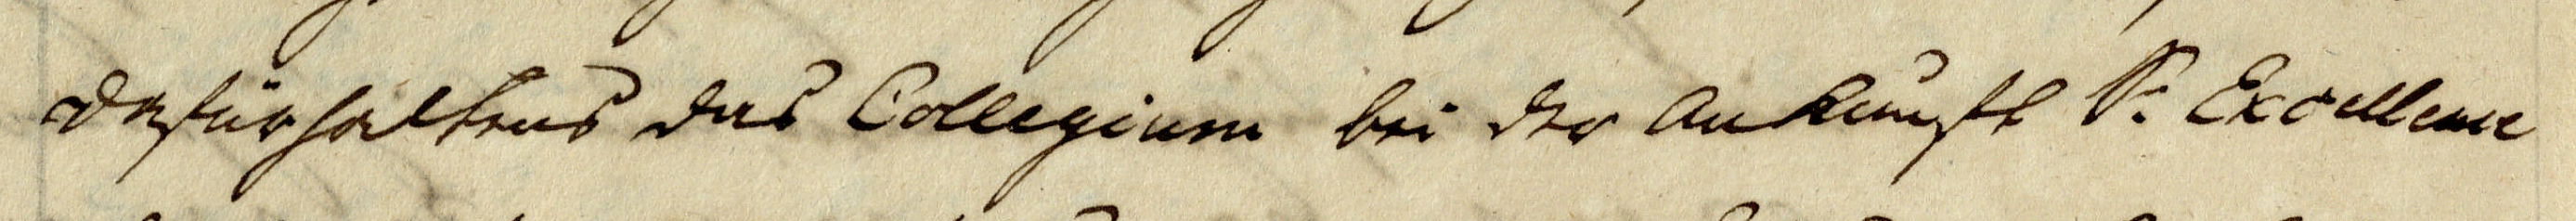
dafürhaltens das Collegium bei der Ankunft Sr Excellence
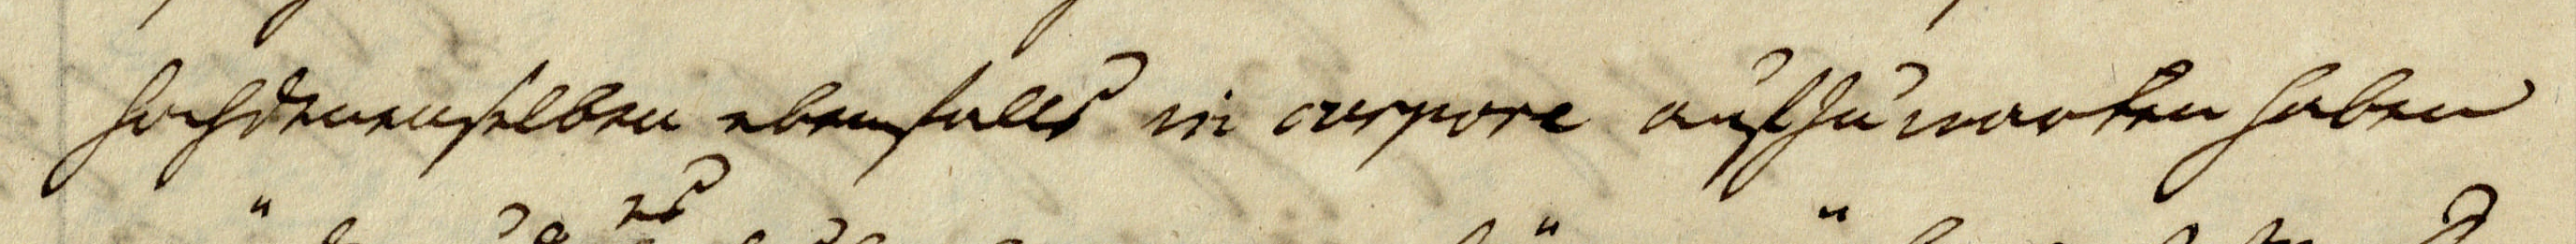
hochdenenselben ebenfalls in corpore aufzuwarten haben
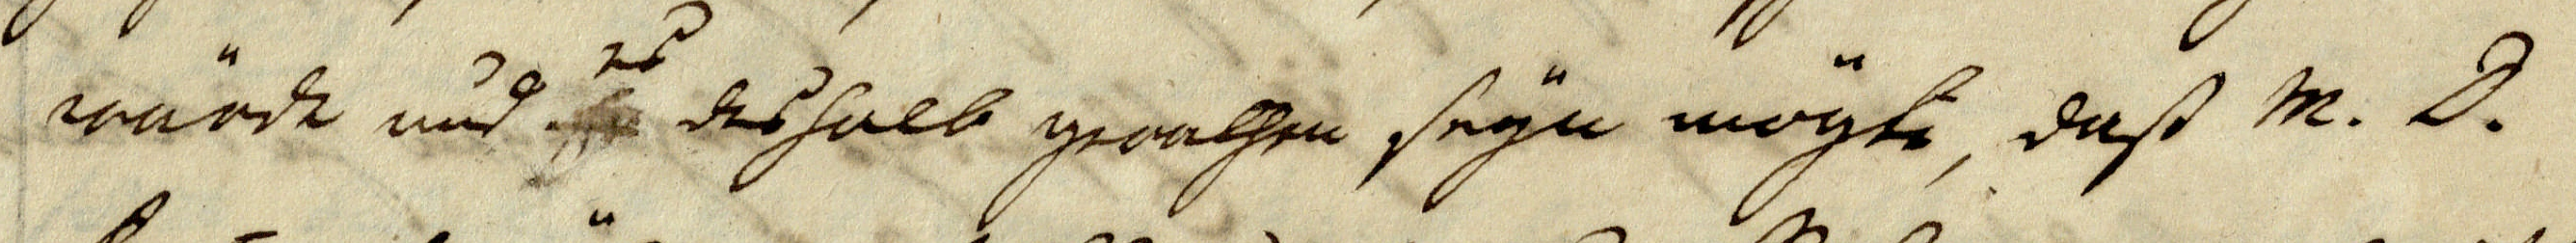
würde und es deshalb gerathen seÿn mögte, daß M. D.
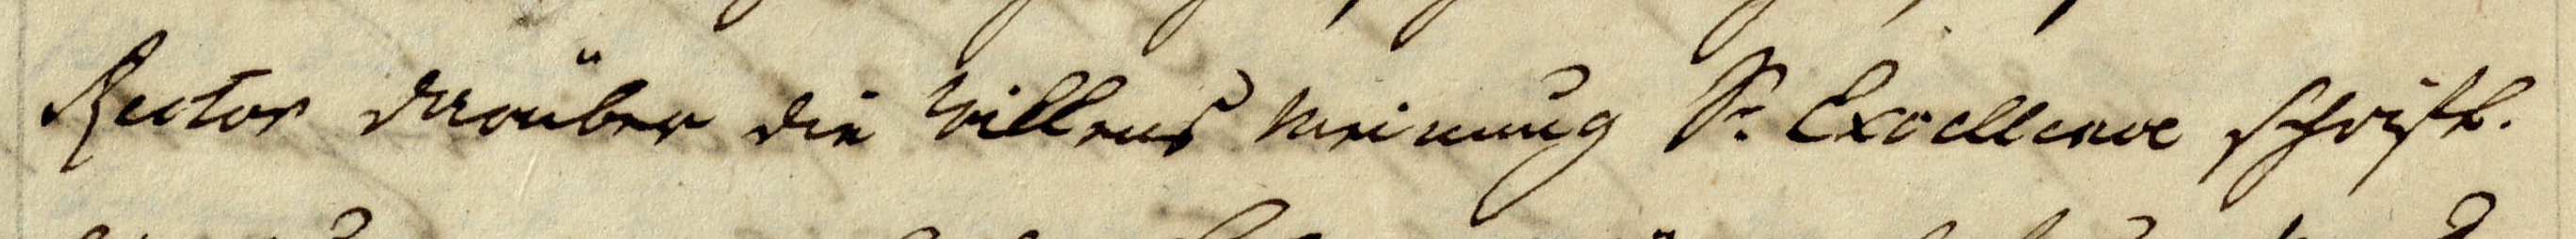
Rector darüber die Willens Meinung Sr Excellence schrift¬
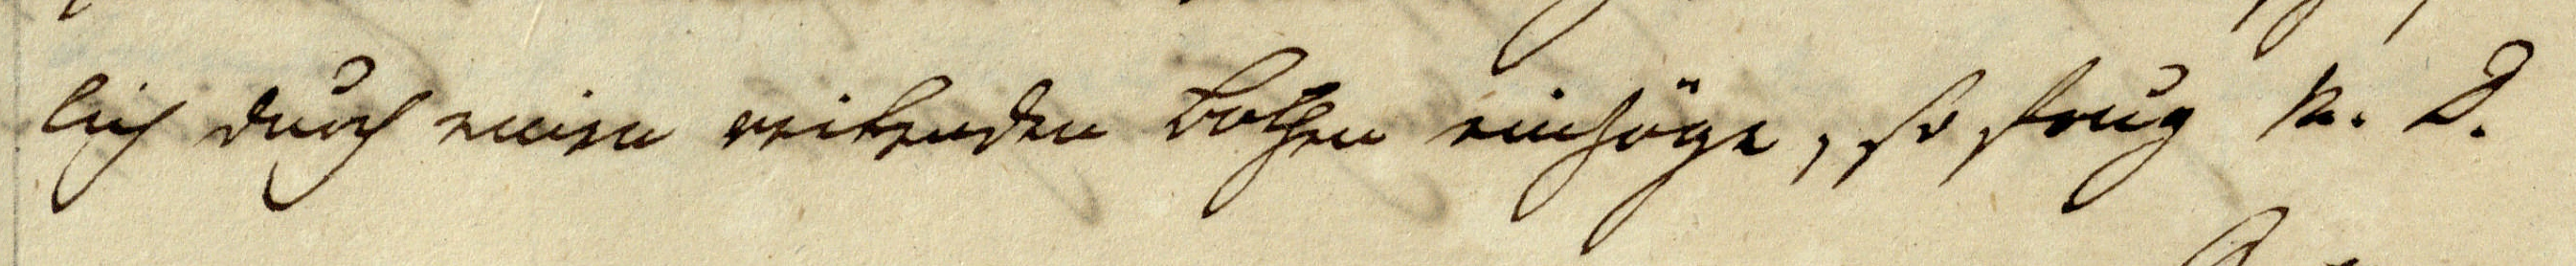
lich durch einen reitenden Bothen einzöge, so frug M. D.
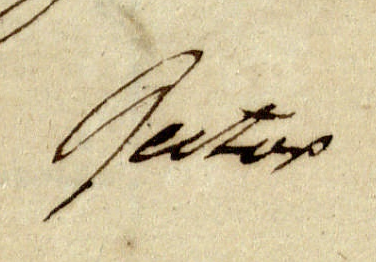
Rector
